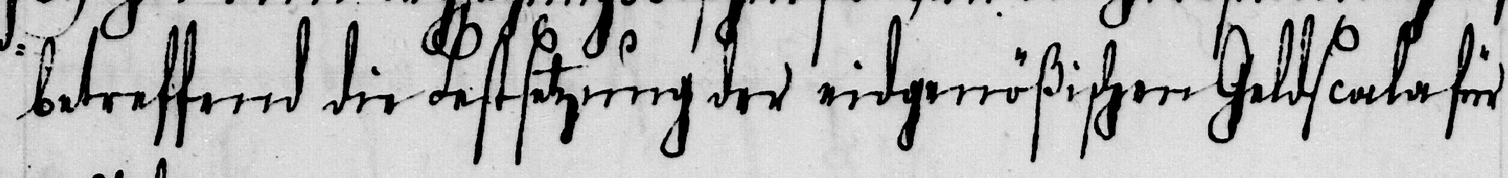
betreffend die Festsetzung der eidgenößischen Geldscala für
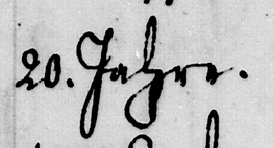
20. Jahre.
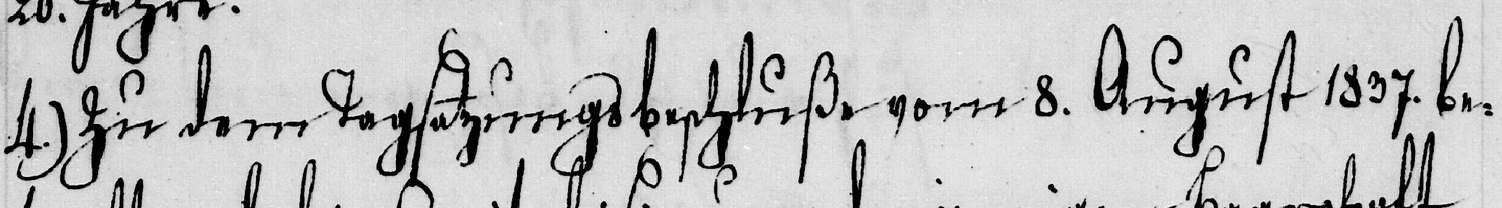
4.) Zu dem Tagsatzungsbeschluße vom 8. August 1837. be¬
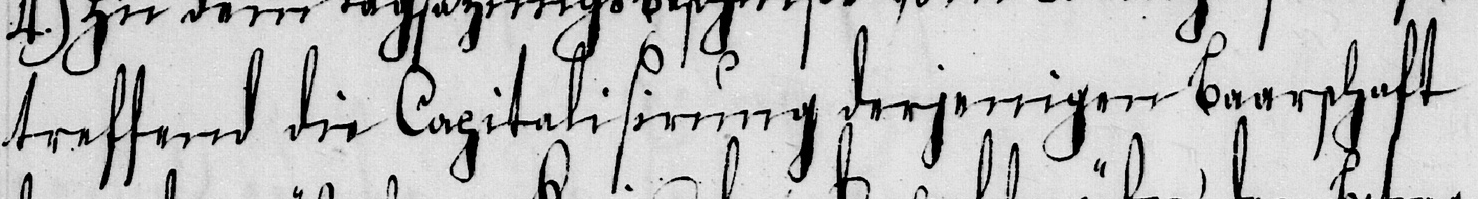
treffend die Capitalisirung derjenigen Baarschaft
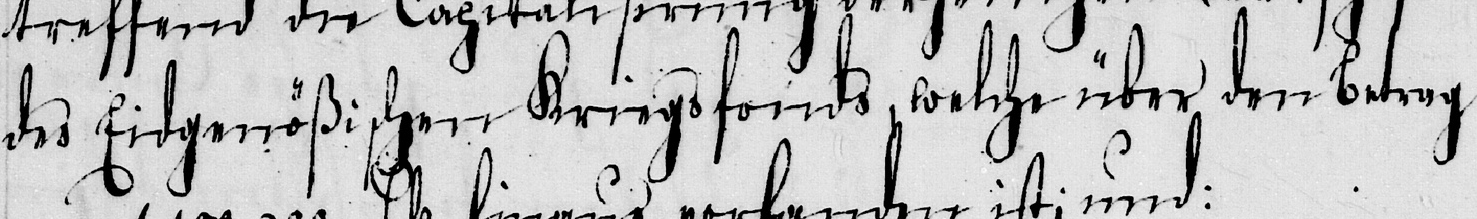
des Eigenößischen Kriegsfonds, welche über den Betrag
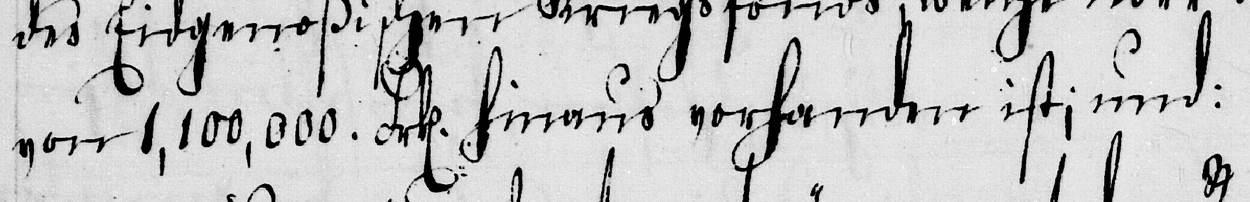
von 1,100,000. Frk[en]. hinaus vorhanden ist; und:
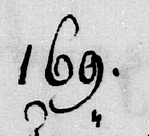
1837.
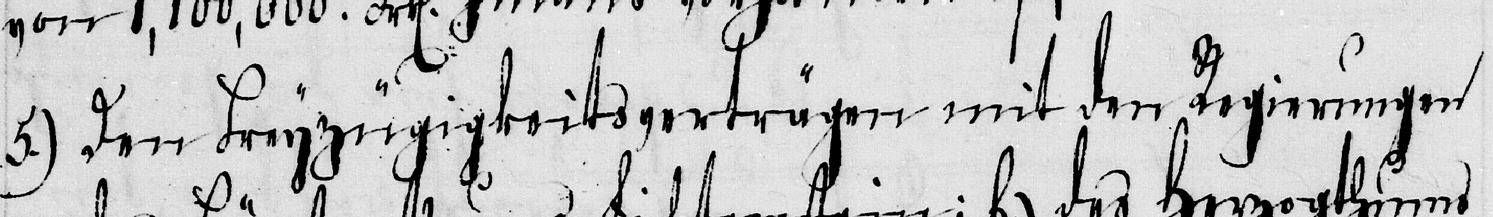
5.) Den Freyzügigkeitsverträgen mit den Regierungen
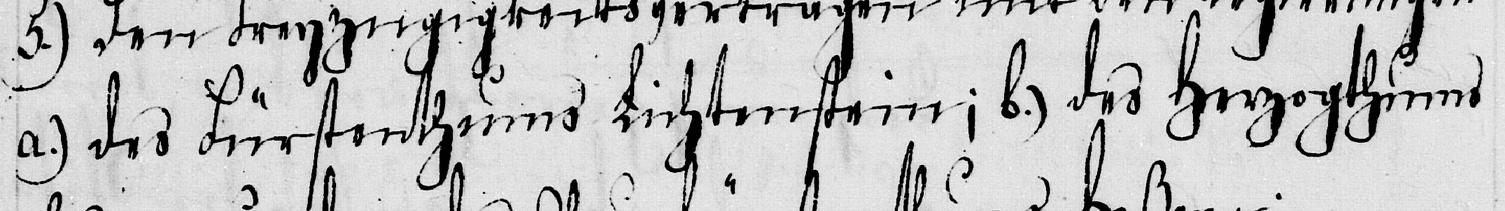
a.) des Fürstenthums Lichtenstein; b.) des Herzogthums
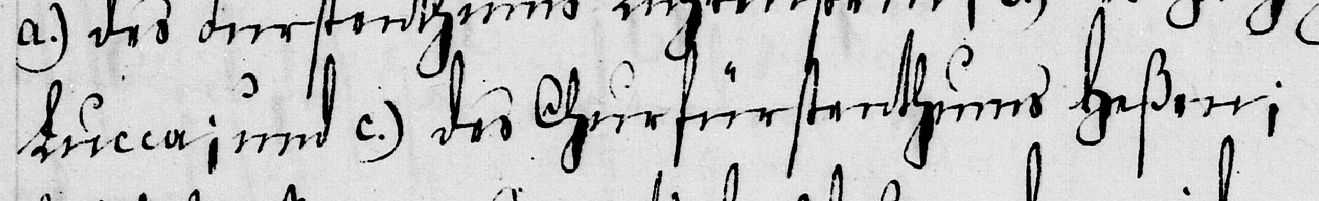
Lucca; und c.) des Churfürstenthums Heßen;
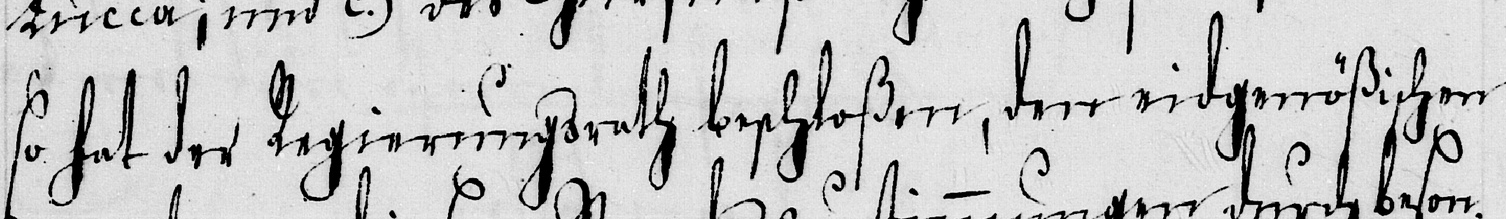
so hat der Regierungsrath beschloßen, den eidgenößischen
